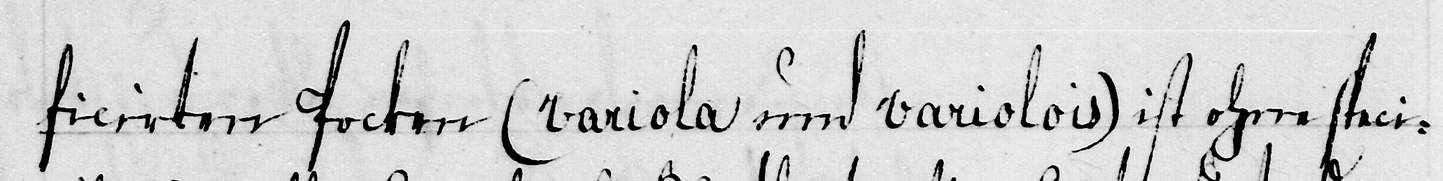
ficirten Pocken (variola und variolois) ist ohne speci¬
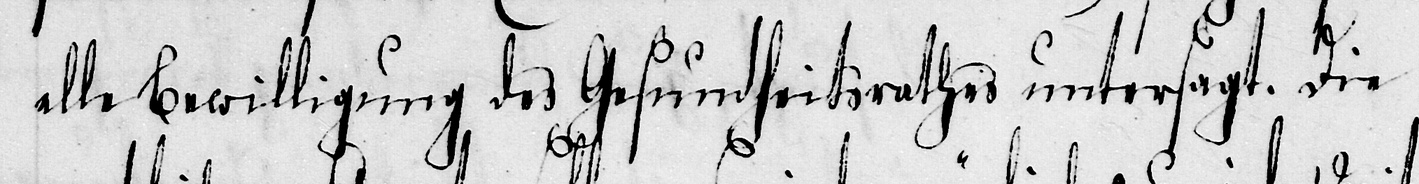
elle Bewilligung des Gesundheitsrathes untersagt. Die
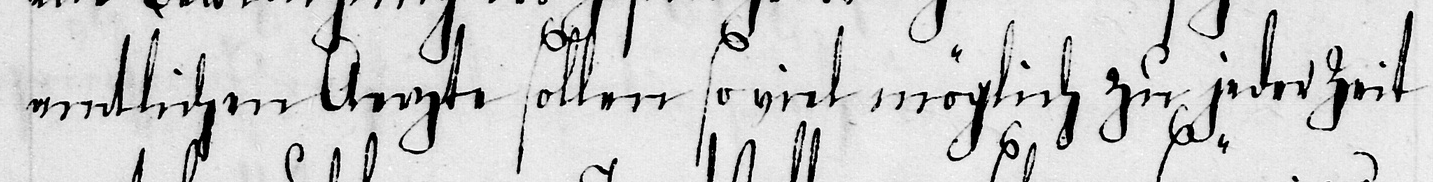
amtlichen Aerzte sollen so viel möglich zu jeder Zeit
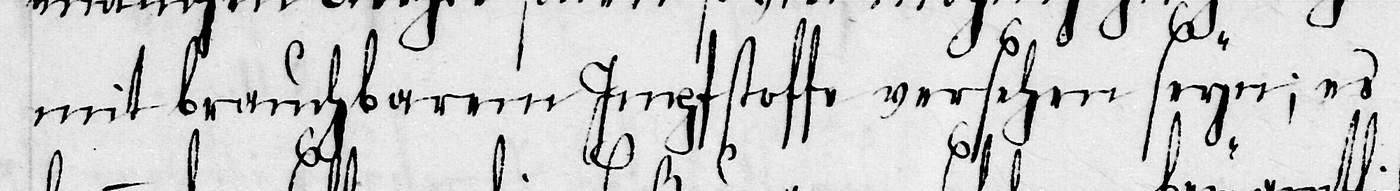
mit brauchbarem Impfstoffe versehen seyn; es
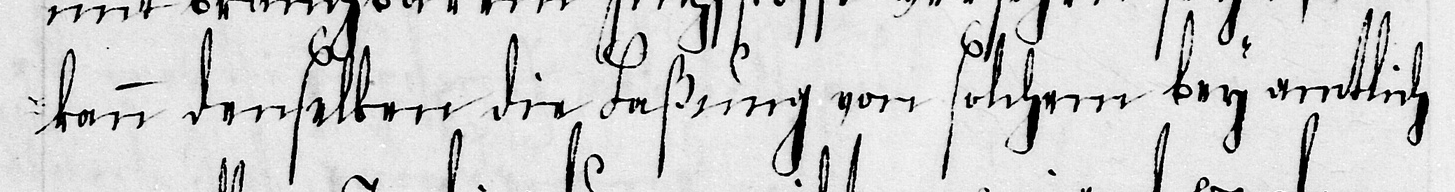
kann denselben die Faßung von solchem bey amtlich
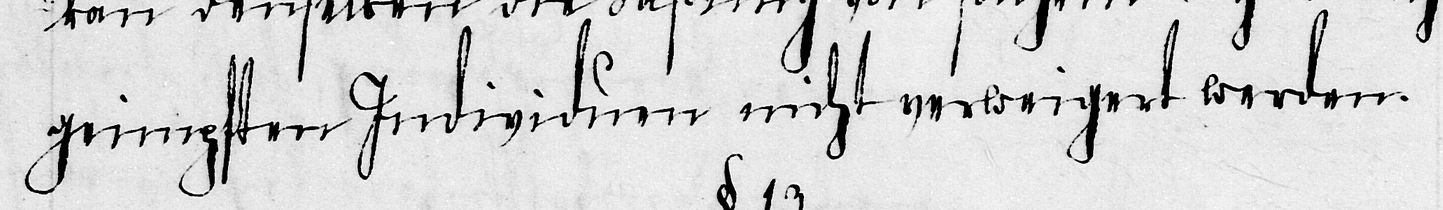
geimpften Individuen nicht verweigert werden.
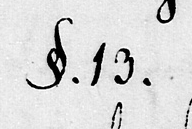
§. 13.
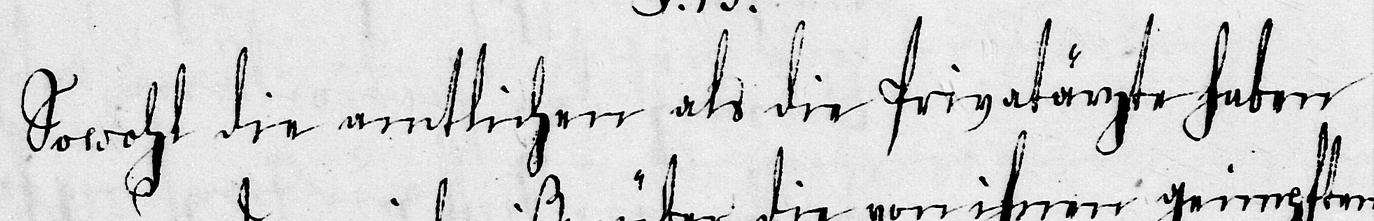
Sowohl die amtlichen als die Privatärzte haben
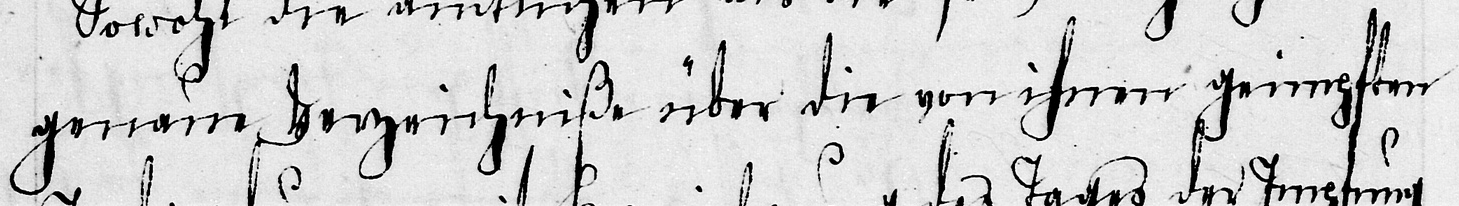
genaue Verzeichniße über die von ihnen geimpften
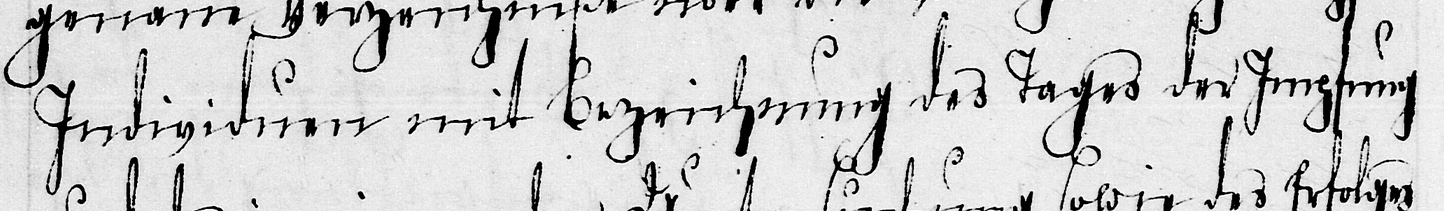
Individuen mit Bezeichnung des Tages der Impfung
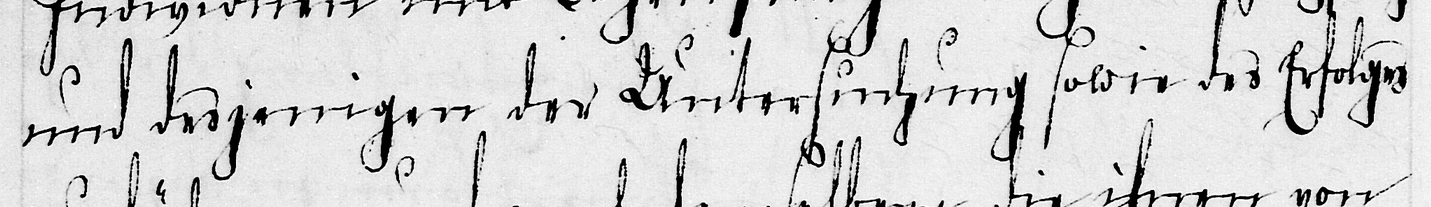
und desjenigen der Untersuchung sowie des Erfolges
